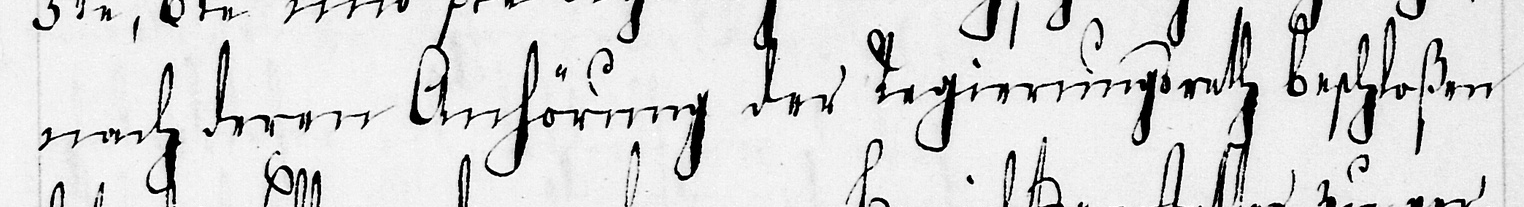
nach deren Anhörung der Regierungsrath beschloßen
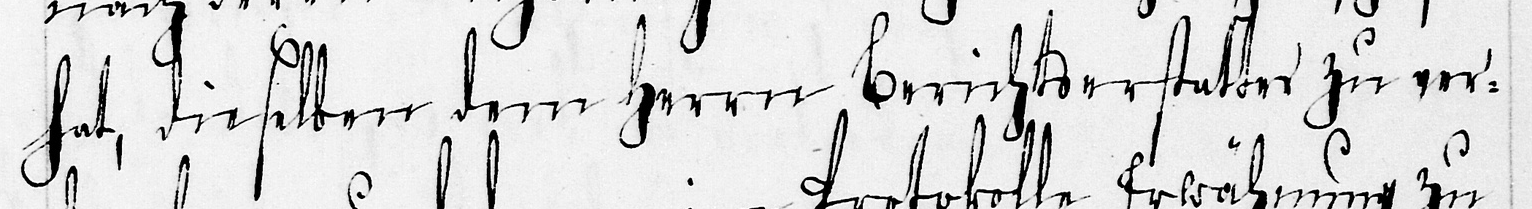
hat, dieselben dem Herrn Berichtserstatter zu ver¬
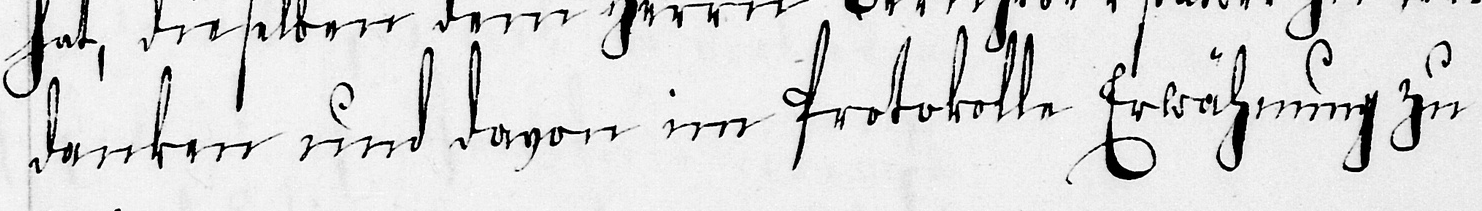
danken und davon im Protokolle Erwähnung zu
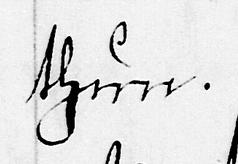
thun.
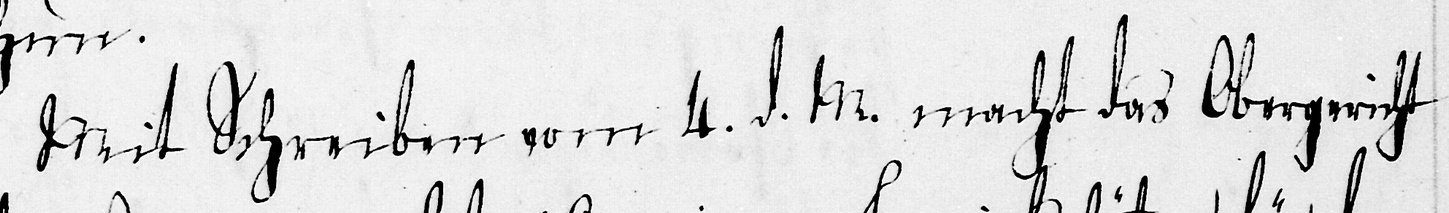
Mit Schreiben vom 4. d. M. macht das Obergericht
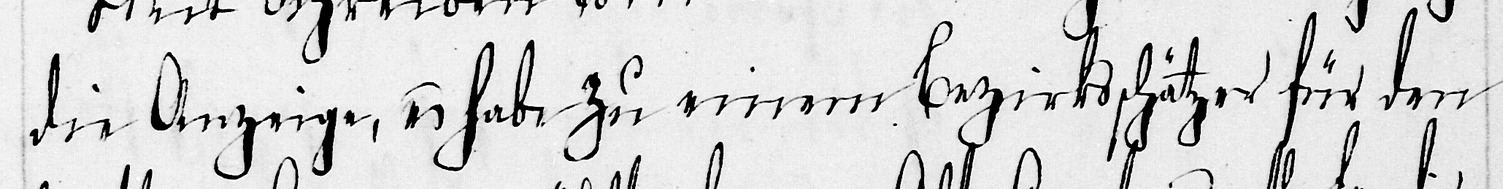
die Anzeige, es habe zu einem Bezirksschätzer für den
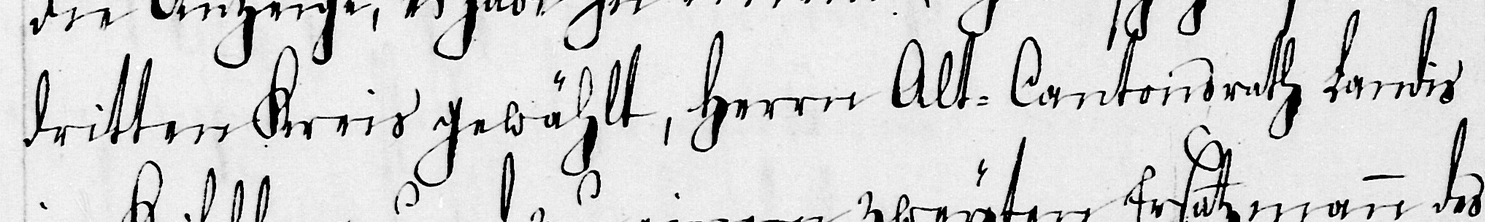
dritten Kreis gewählt, Herrn Alt-Cantonsrath Landis
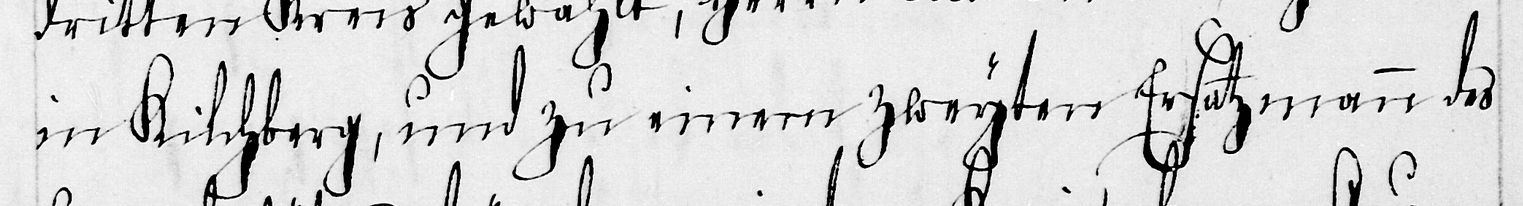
in Kilchberg, und zu einem zweyten Ersatzmann des
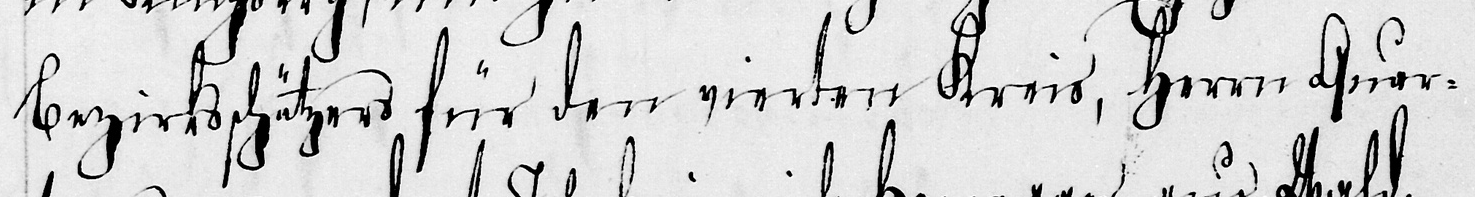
Bezirksschätzers für den vierten Kreis, Herrn Quar¬
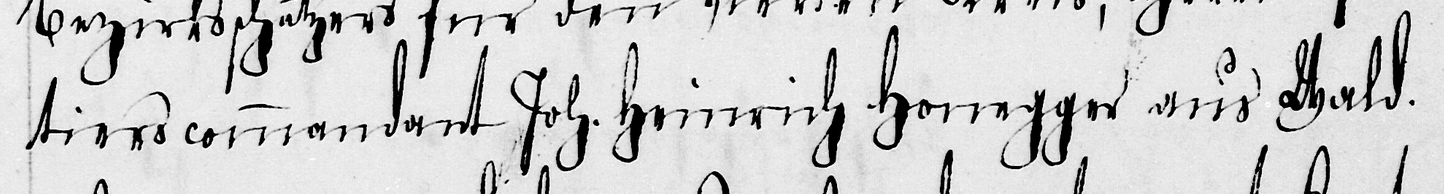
tierscommandant Joh. Heinrich Honegger aus Wald.
